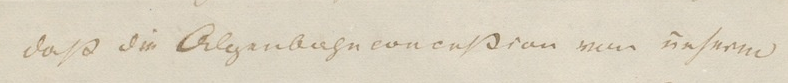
daß die Alpenbahnconceßion von unserm
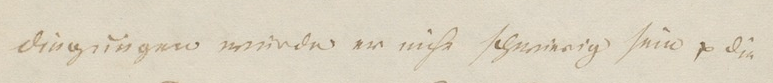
dingungen würde er nicht schwierig sein & die
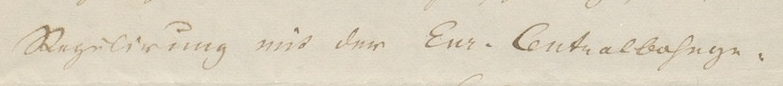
Regulirung mit der Eur. Centralbahnge-
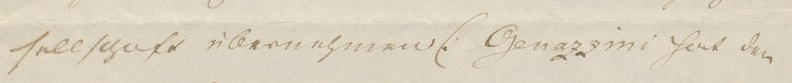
sellschaft übernehmen (: Genazzini hat den
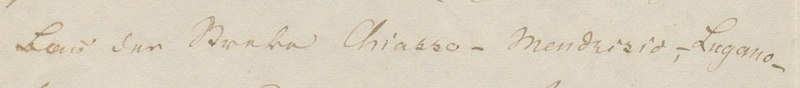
Bau der Streke Chiasso–Mendrisio,–Lugano–
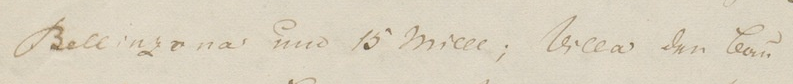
Bellinzona um 15 Milll; Villa den Bau
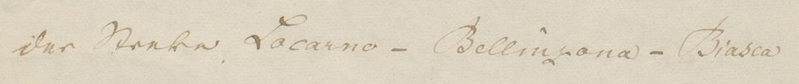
der Streke Locarno – Bellinzona – Biasca
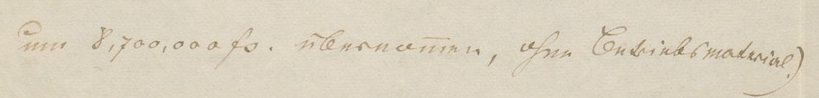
um 8,700,000 fs. übernommen, ohne Betriebsmaterial.)
